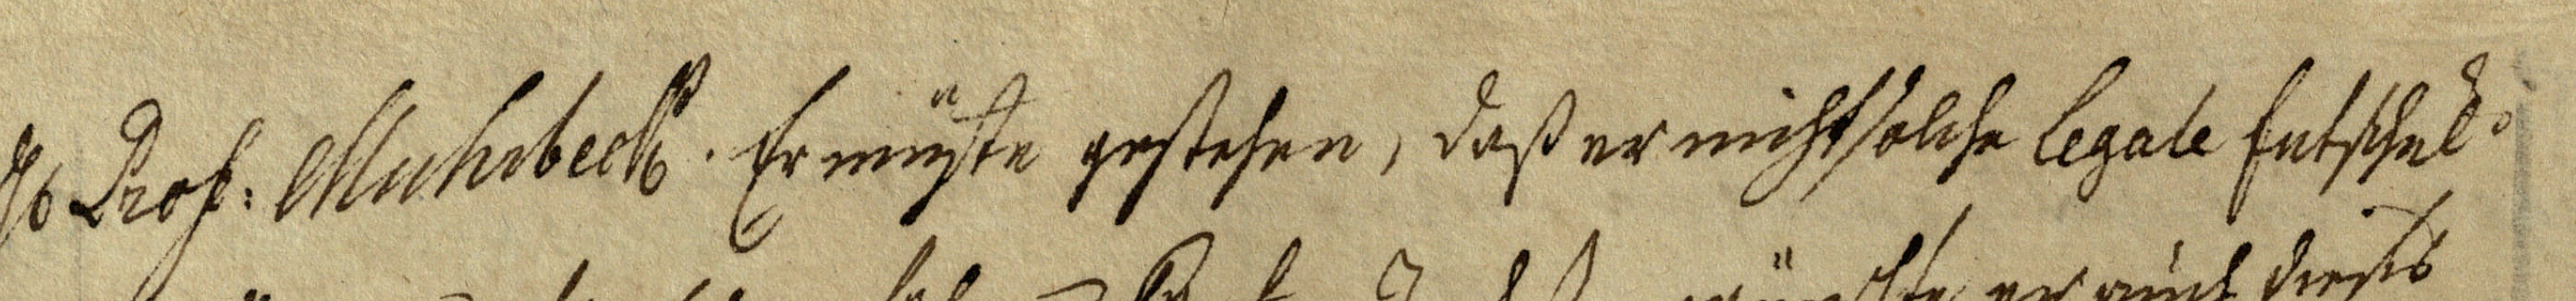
dh Prof. Muhrbeck. Er müßte gestehen, daß er nicht solche legale Entschul¬
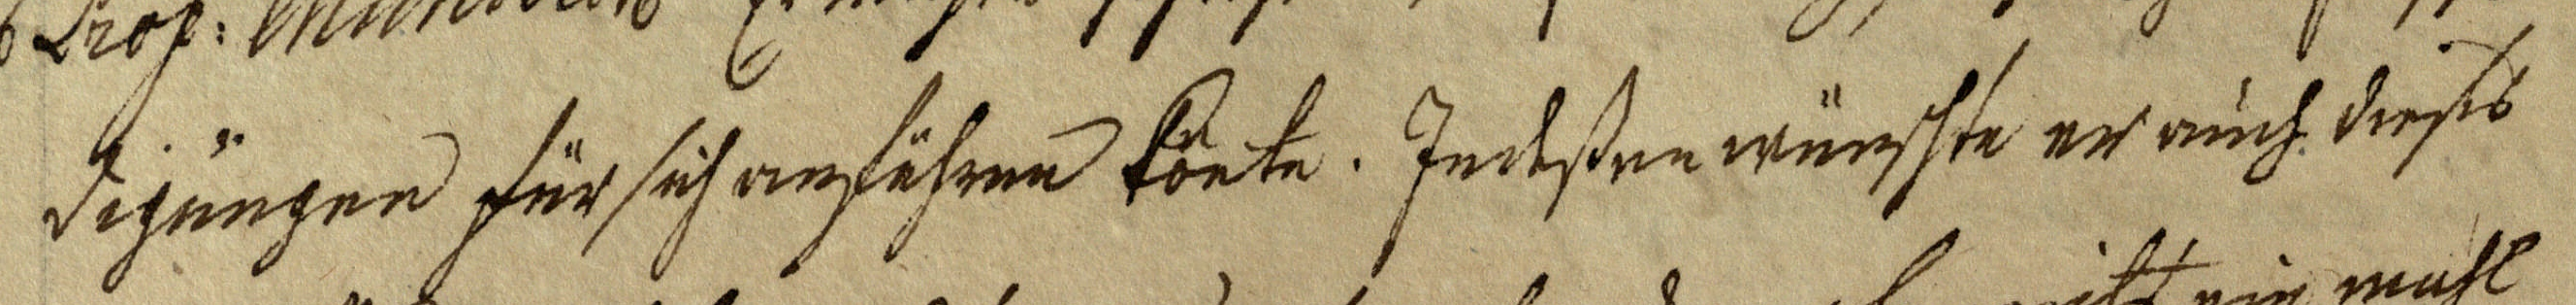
digungen für sich anführen könte. Indeßen wünschte er auch dieses
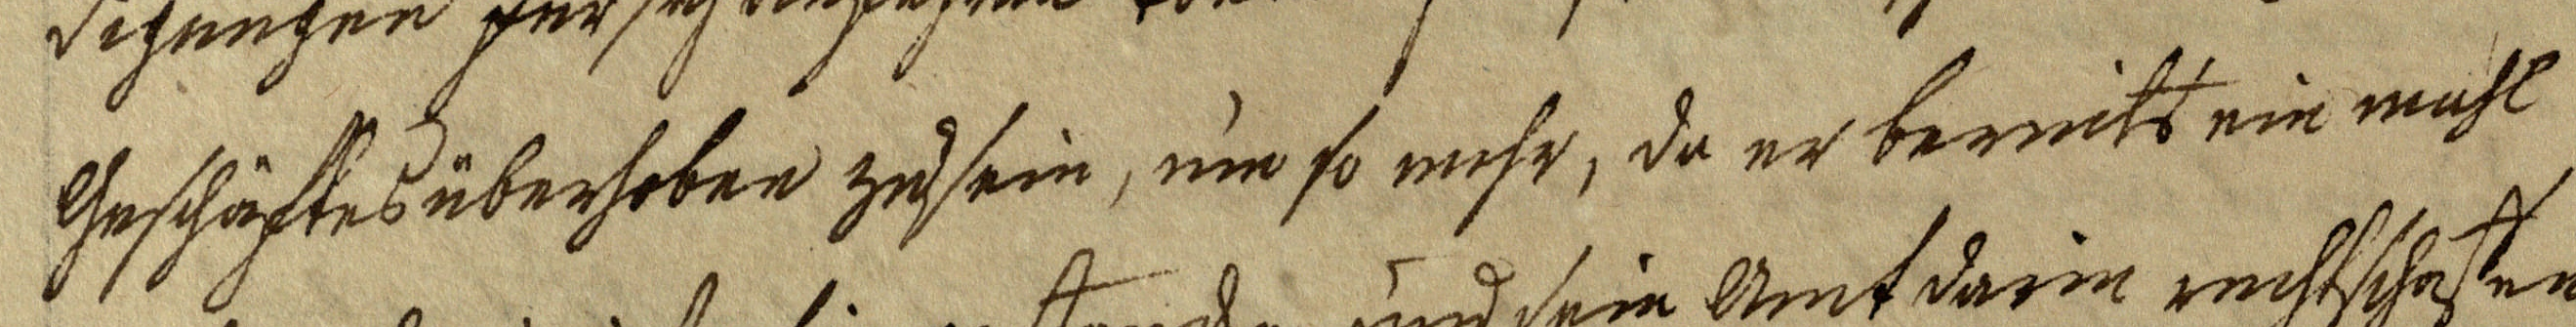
Geschäftes überhoben zusein, um so mehr, da er bereits ein mahl
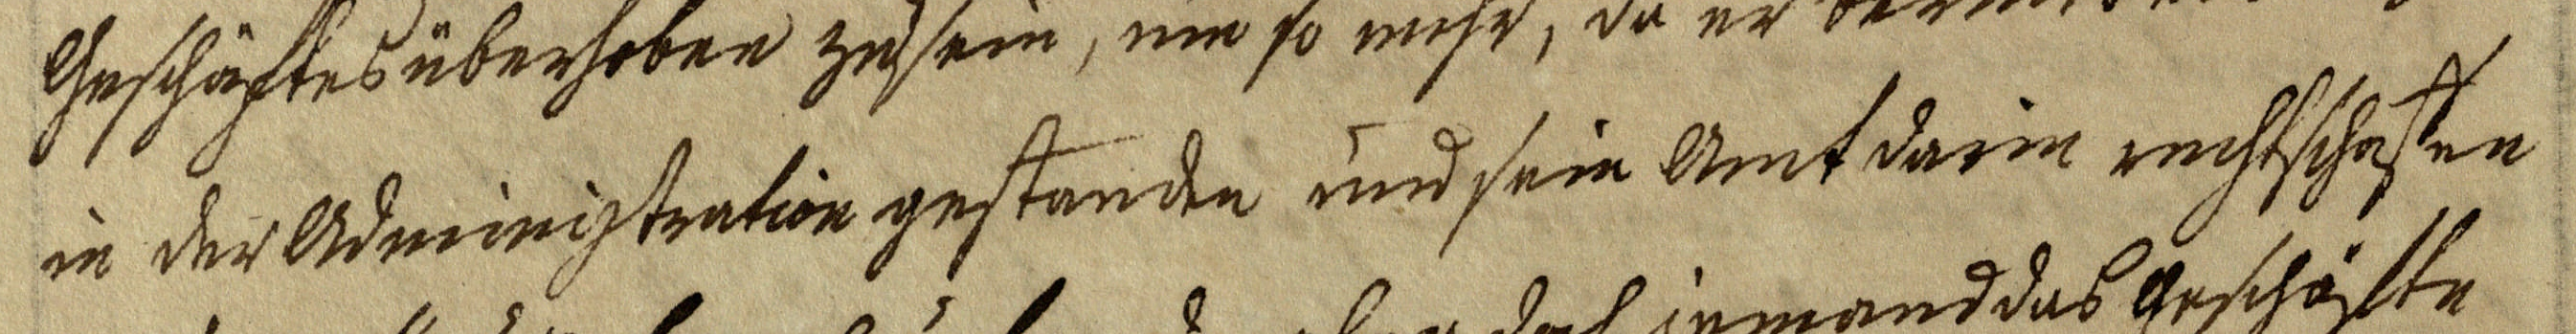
in der Administration gestanden und sein Amt darin rechtscheffen
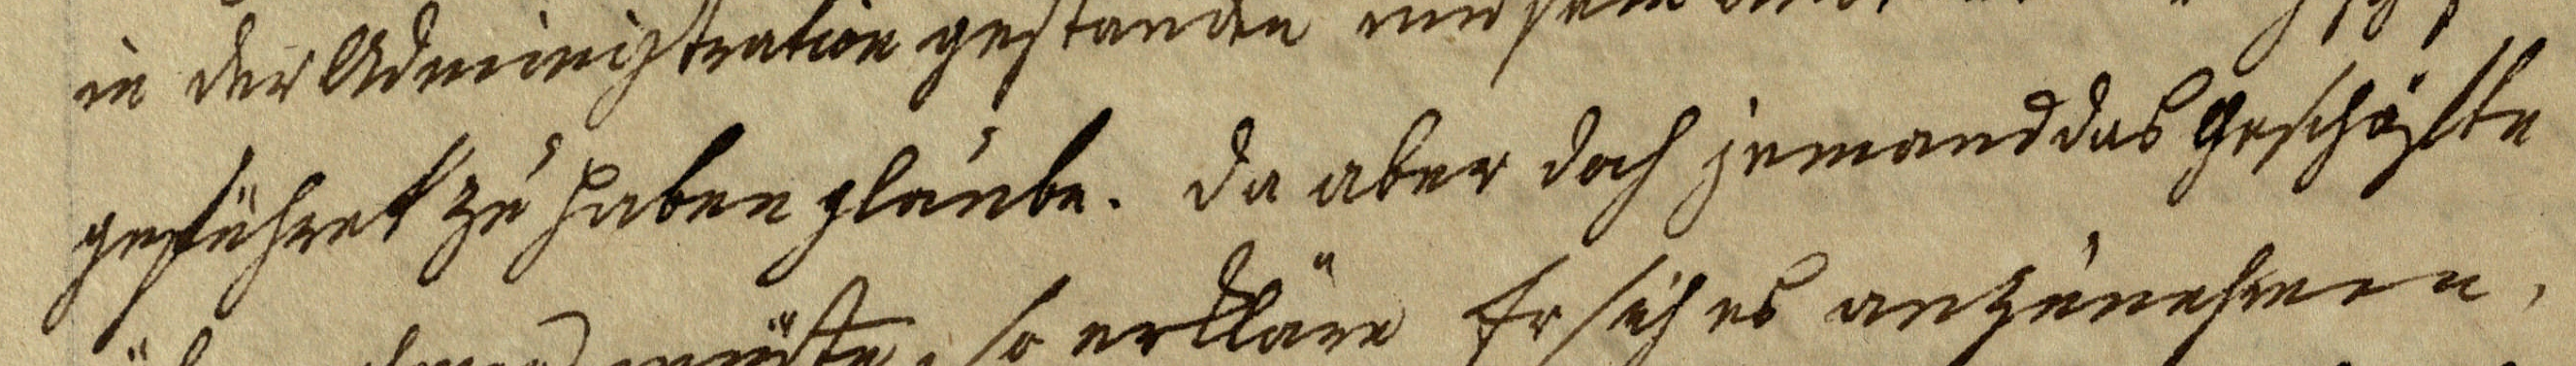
geführet zu haben glaube. Da aber doch jemand das Geschäfte
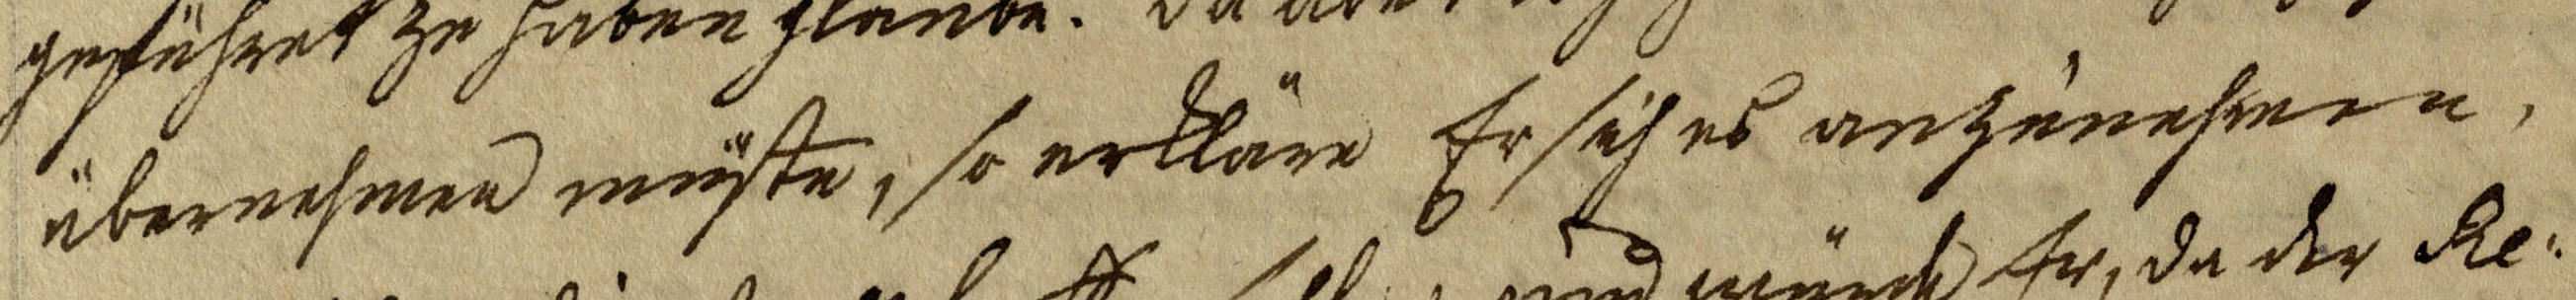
übernehmen müßte, so erkläre Er sich es anzunehmen,
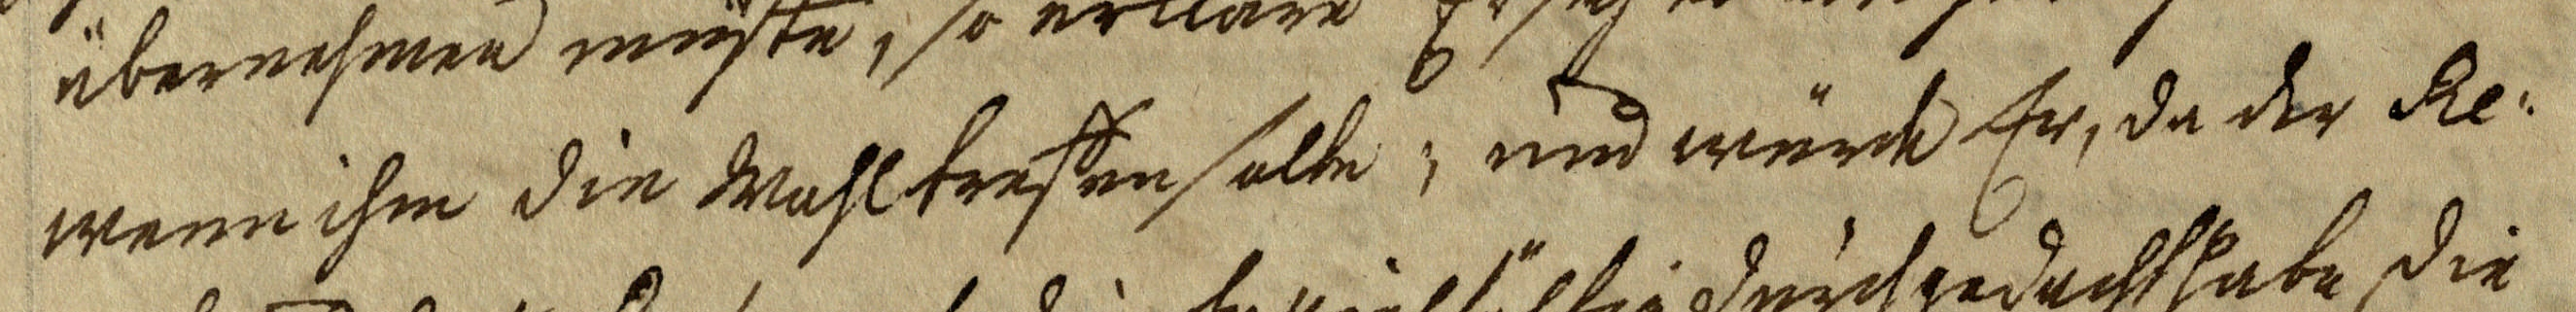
wenn ihm die Wahl treffen solte, und würde Er, da der Re¬
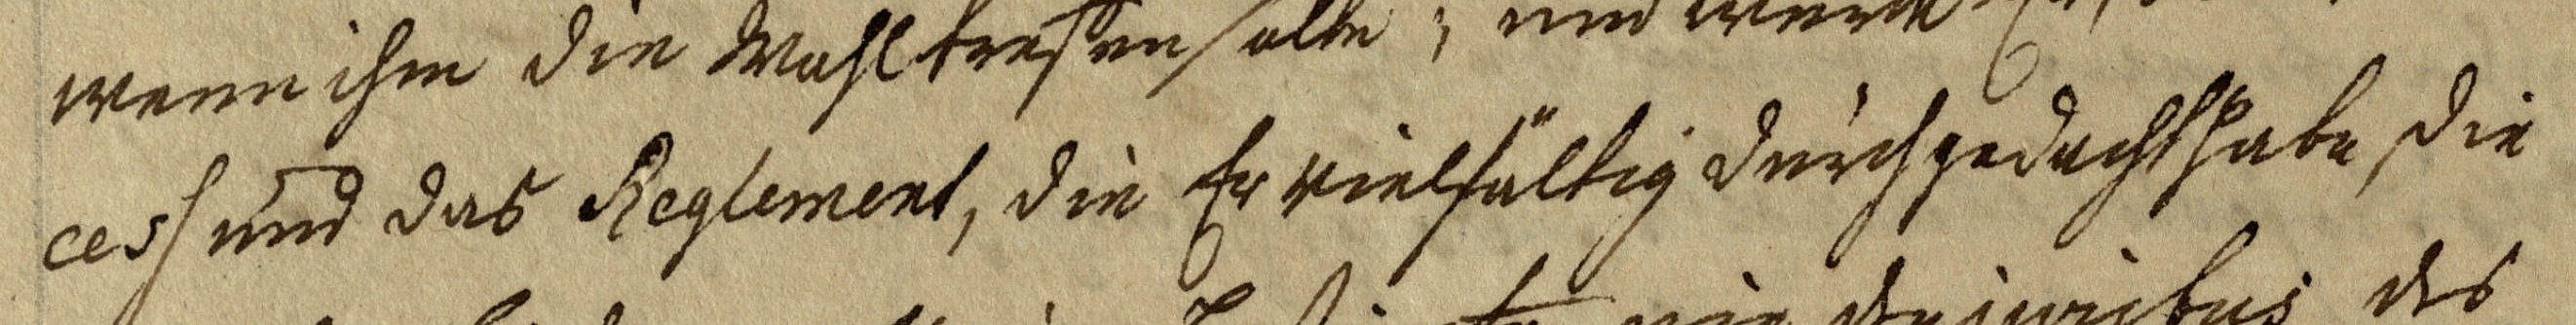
cess und das Reglement, die Er vielfältig durch gedacht habe, die
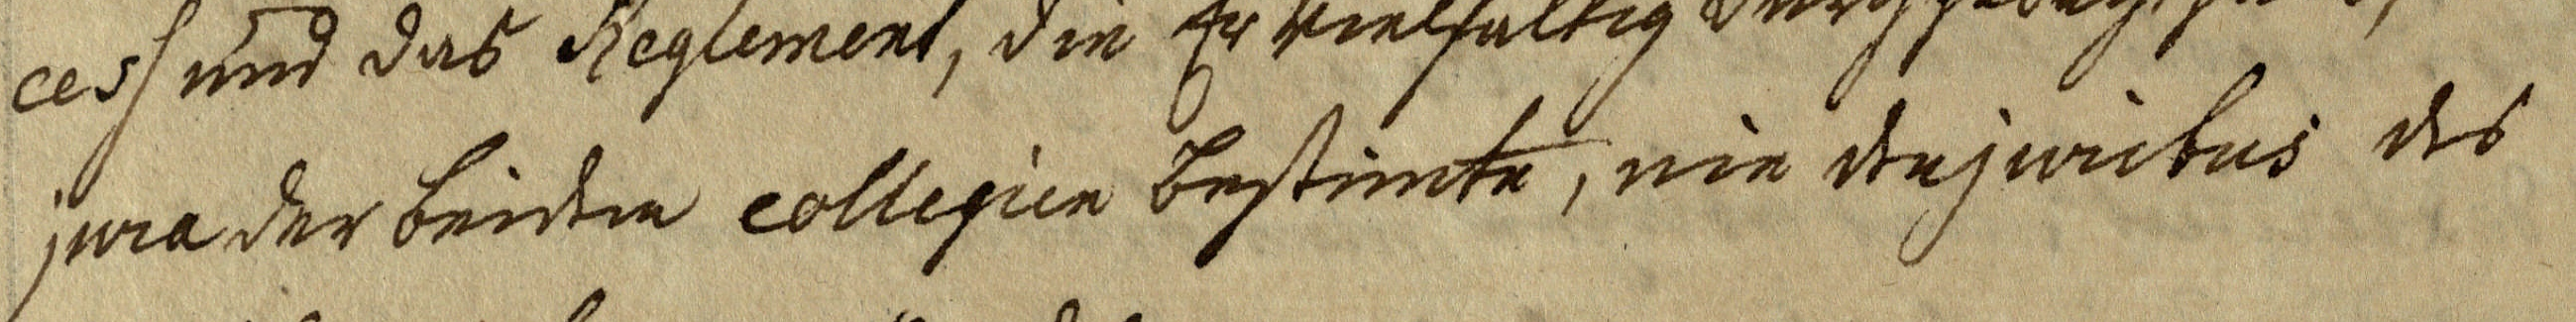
jura der beiden collegien bestimte, ein denjuritus des
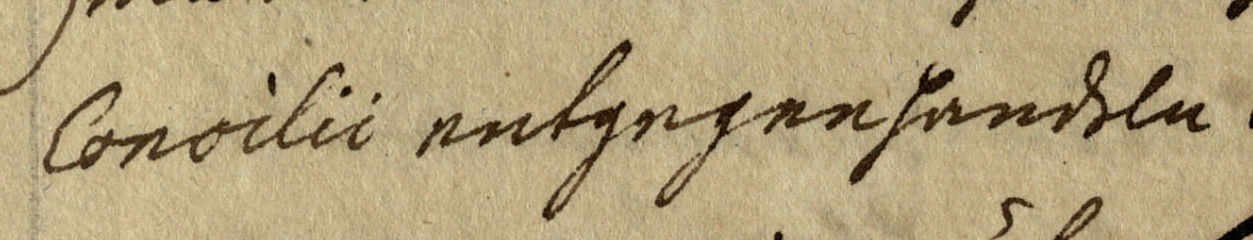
Concilii entgegenhandeln
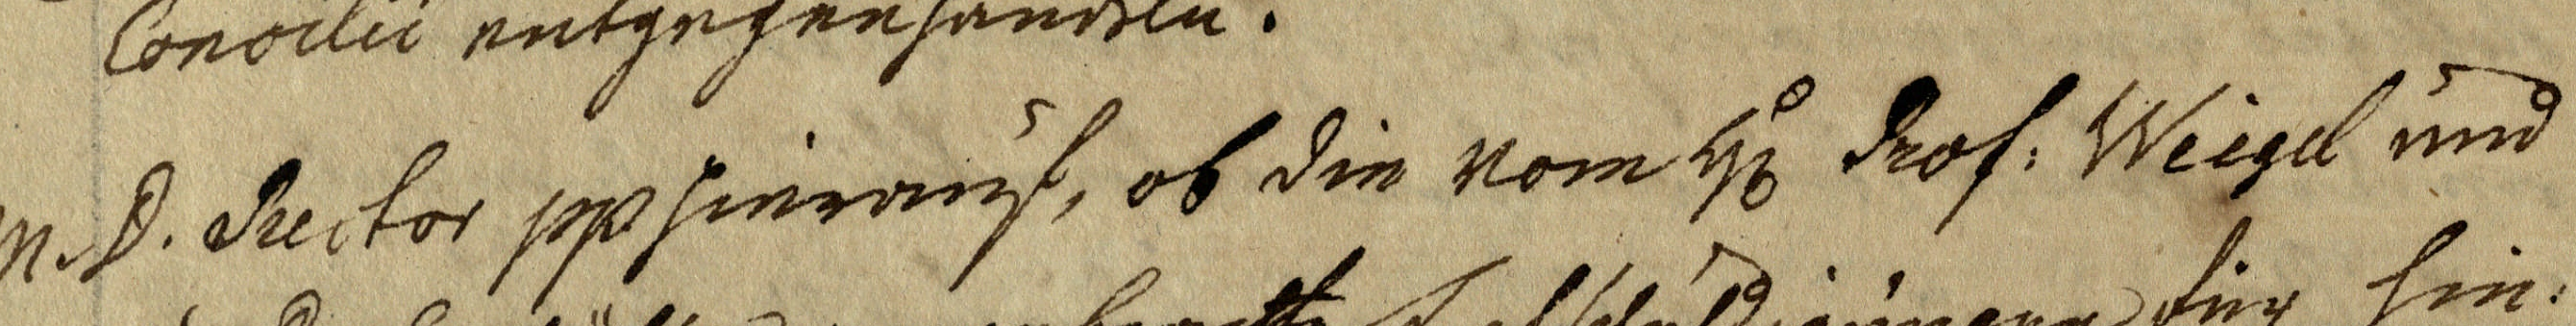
M. D. Rector pp hierauf, ob die vom H Prof. Weigel und
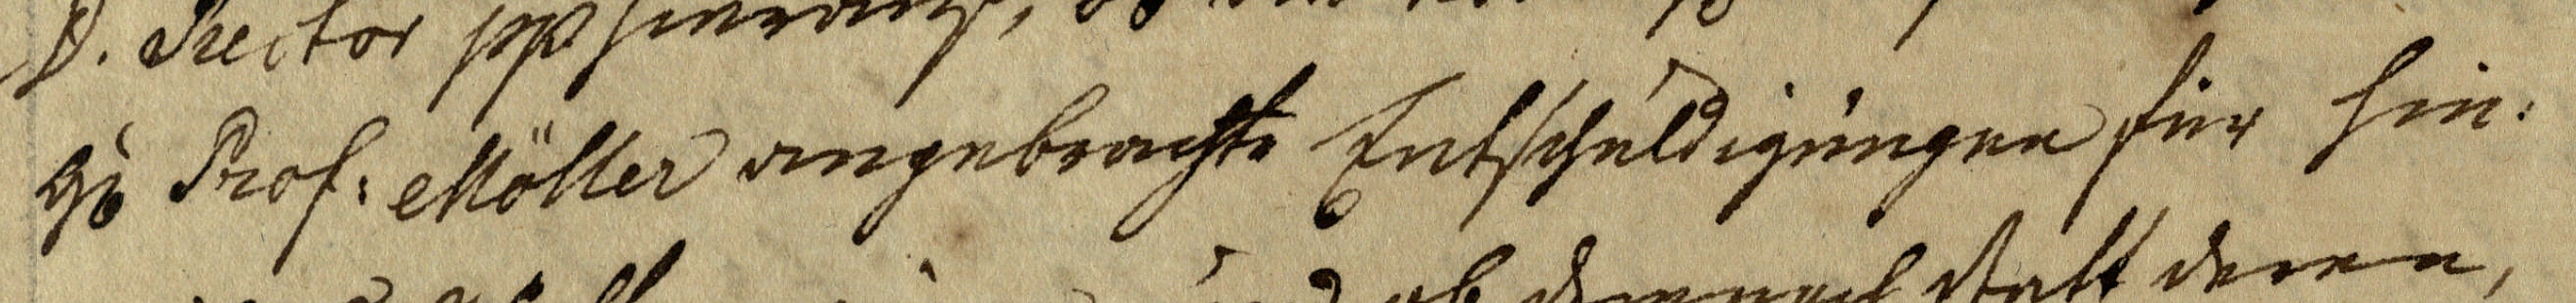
dh Prof. Möller angebrachte Entschuldigungen für hin¬
